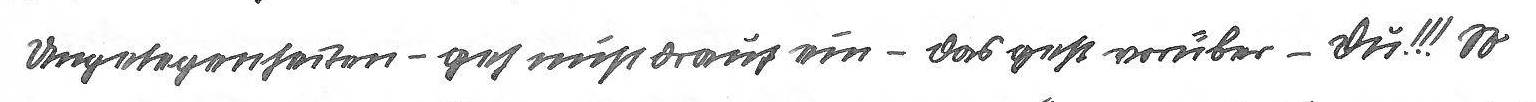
Ungelegenheiten – geh nicht drauf ein – das geht vorüber – Du!!! So
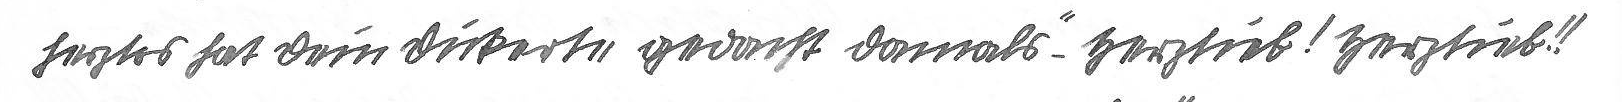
herzlos hat Dein Dickerle gedacht damals!” – Herzlieb! Herzlieb!!
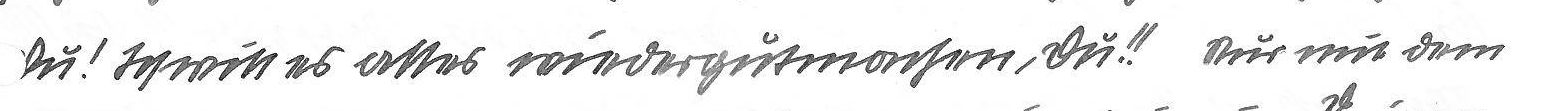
u! Ich will es alles wiedergutmachen, Du!! Nur mit dem
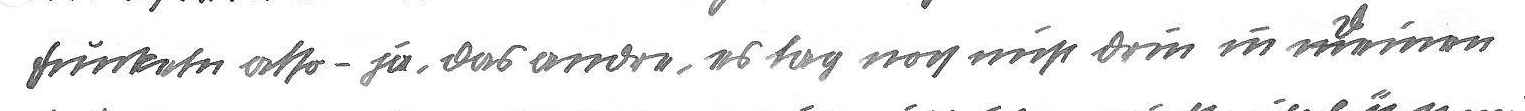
Funkeln also – ja, das andre, es lag noch nicht drin in mDeinen
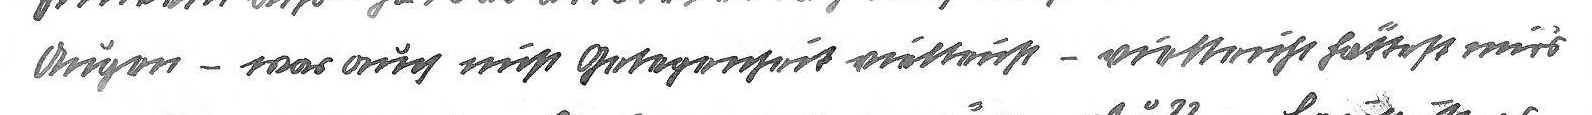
Augen – war auch nicht Gelegenheit vielleicht – vielleicht hättest mir’s
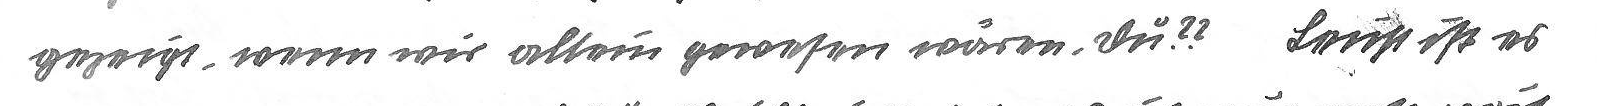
gezeigt, wenn wir allein gewesen wären, Du?? Leicht ist es
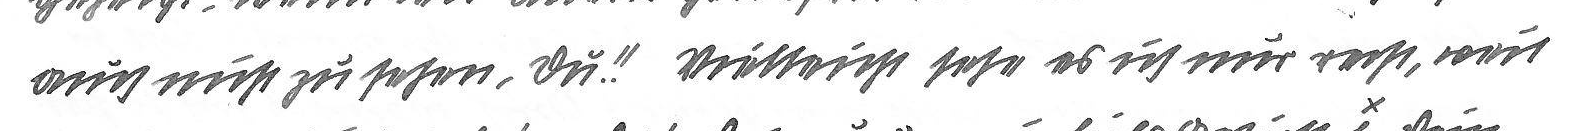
auch nicht zu sehen, Du!! Vielleicht sehe es ich nur recht, weil
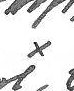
x
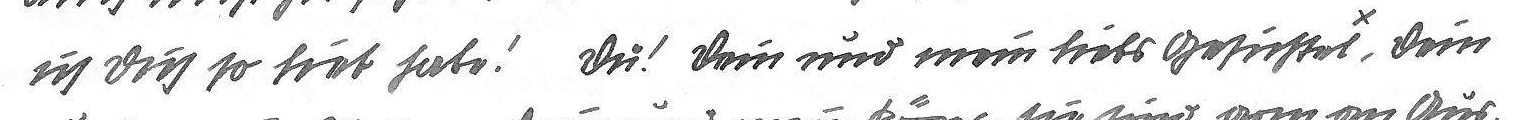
ich Dich so lieb habe! Du! Dein und mein liebs Gesichtel, Dein
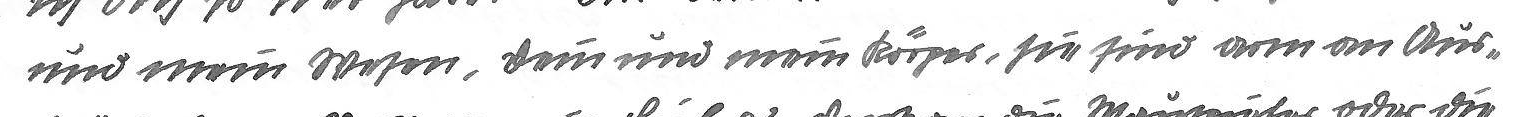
und mein Wesen, Dein und mein Körper, sie sind arm an Aus¬
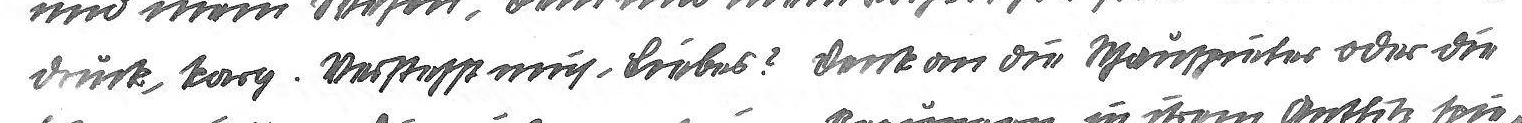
druck, karg. Verstehst mich, Liebes? Denk an die Schauspieler oder die
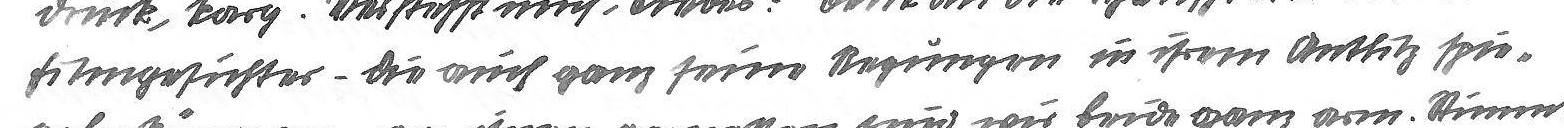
Filmgesichter – die auch ganz feine Regungen in ihrem Antlitz spie¬
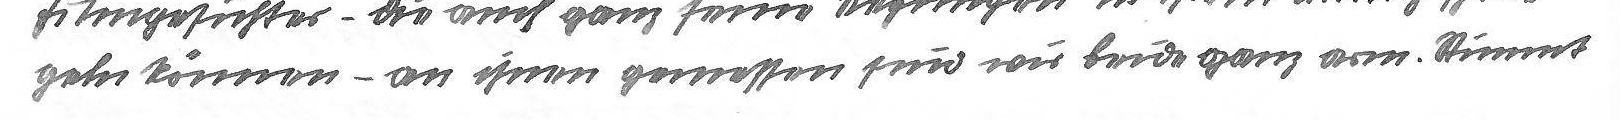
geln können – an ihnen gemessen sind wir beide ganz arm. Stimmt
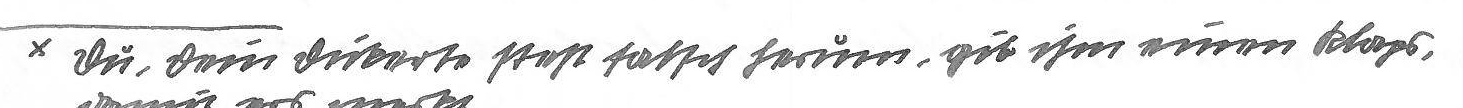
x Du, Dein Dickerle steht falsch herum, gib ihm einen Klaps,
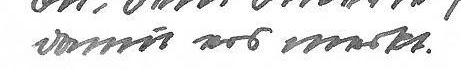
damit ers merkt.
